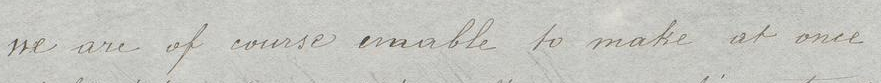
we are of course unable to make at once
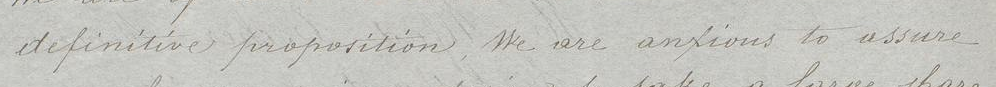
definitive proposition, We are anxious to assure
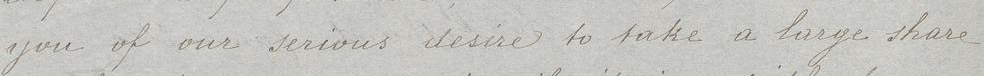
you of our serious desire to take a large share
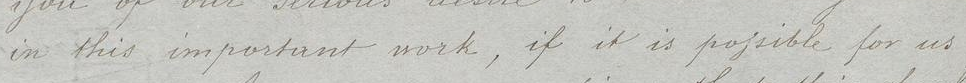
in this important work, if it is possible for us
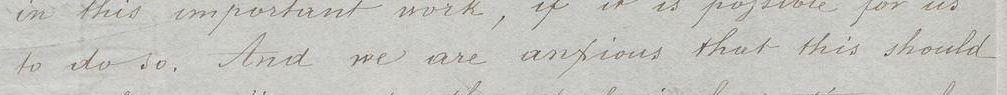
to do so. And we are anxious that this should
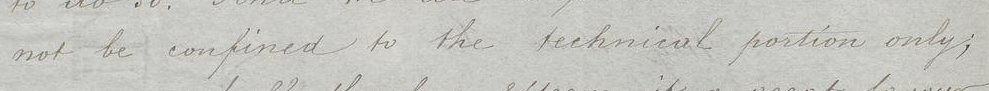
not be confined to the technical portion only;
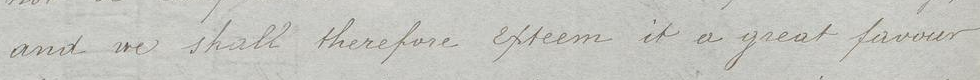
and we shall therefore esteem it a great favour
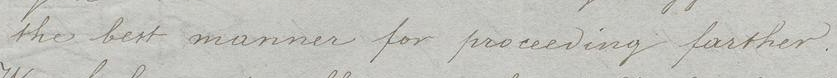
the best manner for proceeding farther.
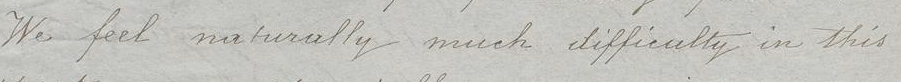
We feel naturally much difficulty in this
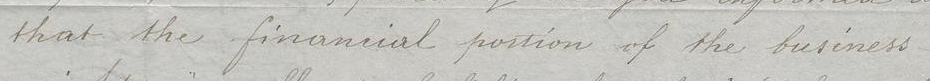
that the financial portion of the business
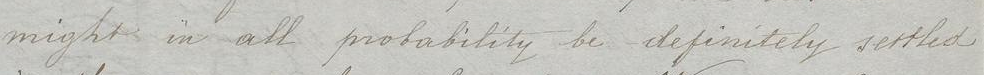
might in all probability be definitely settled
